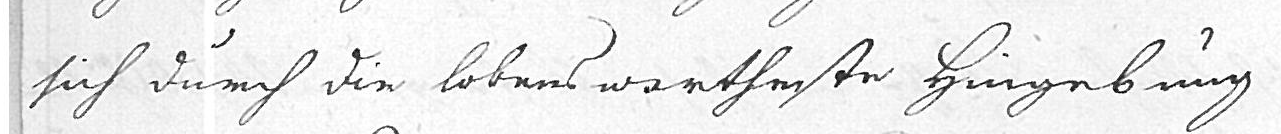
sich durch die lobenswertheste Hingebung
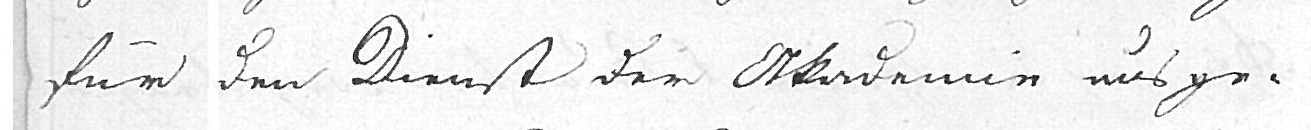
für den Dienst der Akademie ausge-
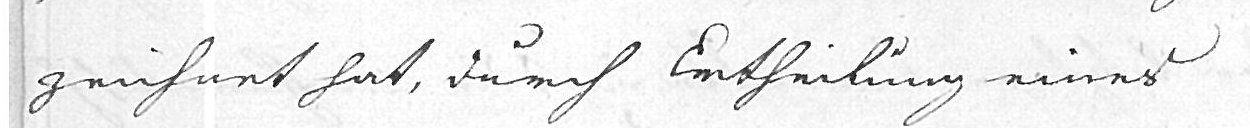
zeichnet hat, durch Ertheilung eines
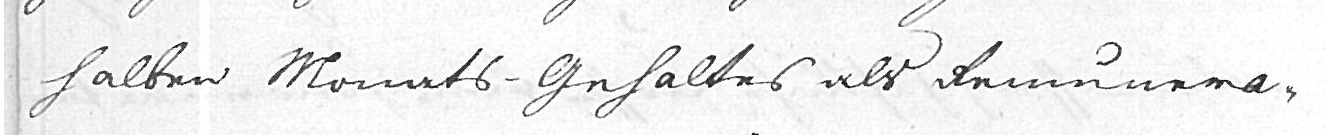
halben Monats-Gehaltes als Remunera-
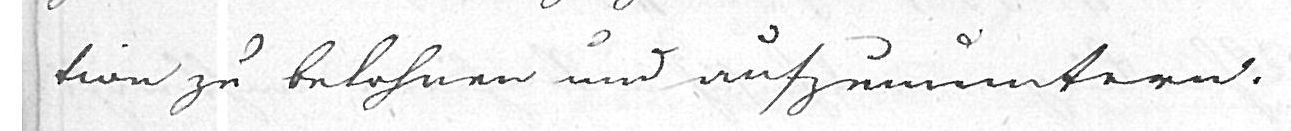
tion zu belohnen und aufzumuntern.
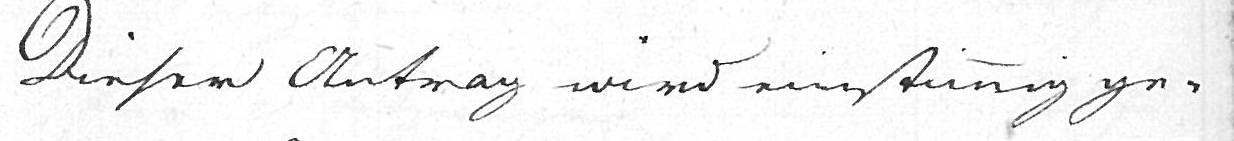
Dieser Antrag wird einstimmig ge-
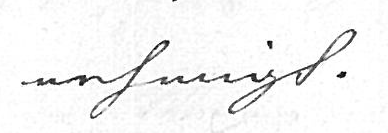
nehmigt.
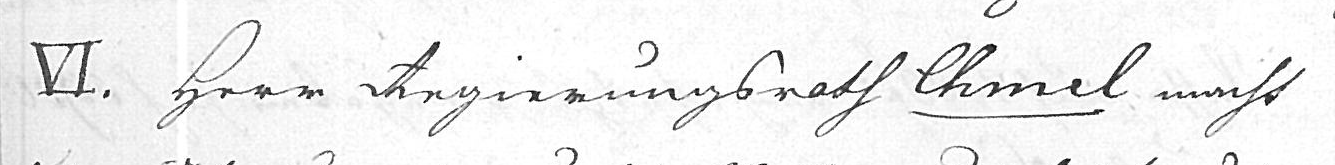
VI. Herr Regierungsrath Chmel macht
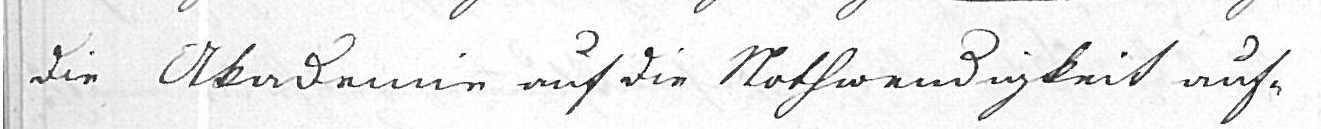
die Akademie auf die Nothwendigkeit auf-
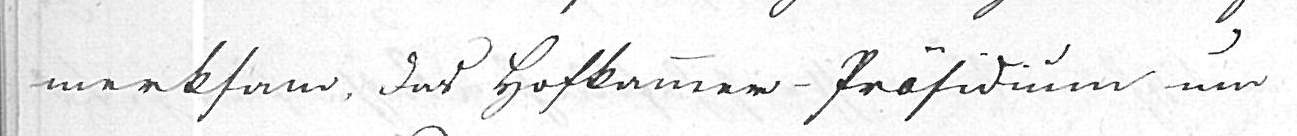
merksam, das Hofkammer-Präsidium um
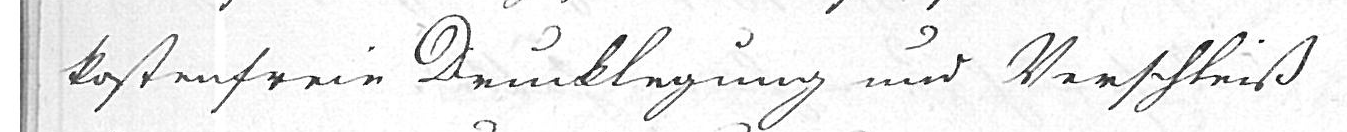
kostenfreie Drucklegung und Verschleiß
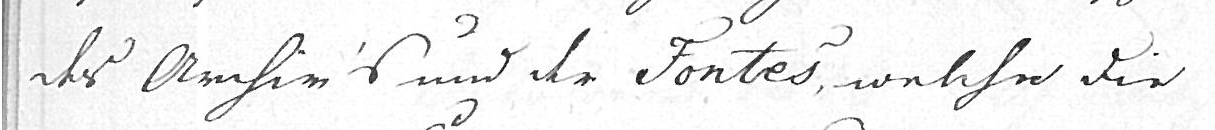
des Archiv's und der Fontes, welche die
